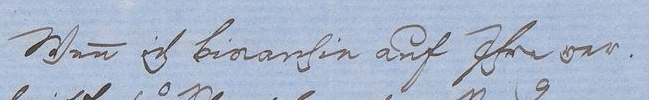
Wenn ich bisanhin auf Ihre ver-
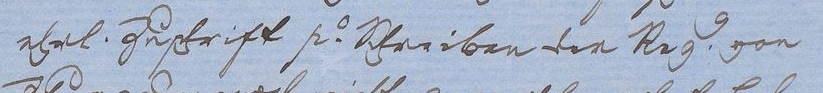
ehrl. Zuschrift po Schreibender Regg von
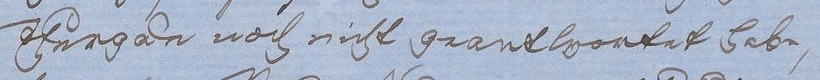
Thurgau noch nicht geantwortet habe,
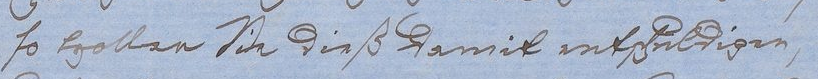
so wollen Sie dieß damit entschuldigen,
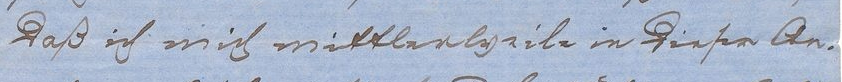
daß ich mich mittlerweile in dieser An-
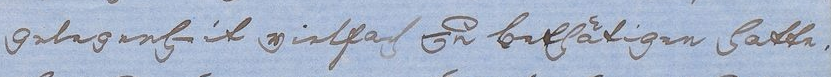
gelegenheit vielfach zu bethätigen hatte.
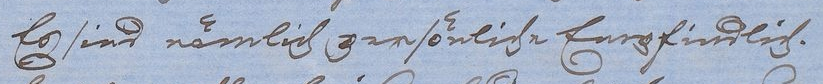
Es sind nämlich persönliche Empfindlich-
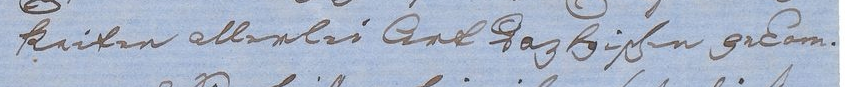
keiten allerlei Art dazwischen gekom-
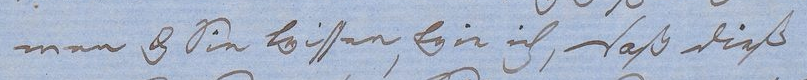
men & Sie wissen, wie ich, daß dieß
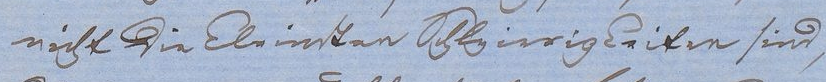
nicht die kleinsten Schwierigkeiten sind,
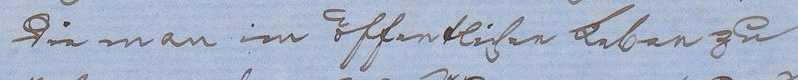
die man im öffentlichen Leben zu
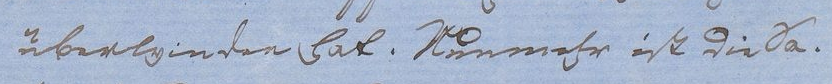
überwinden hat. Nunmehr ist die Sa-
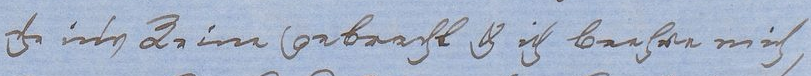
che in's Reine gebracht & ich beehre mich,
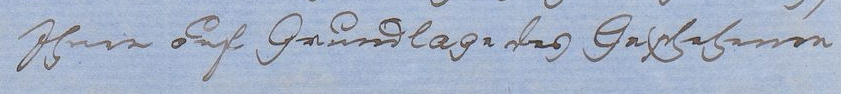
Ihnen auf Grundlage des Geschehenen
